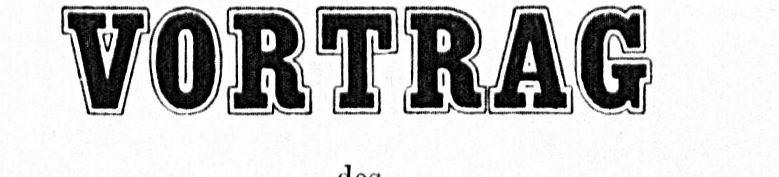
VORTRAG
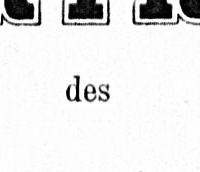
des
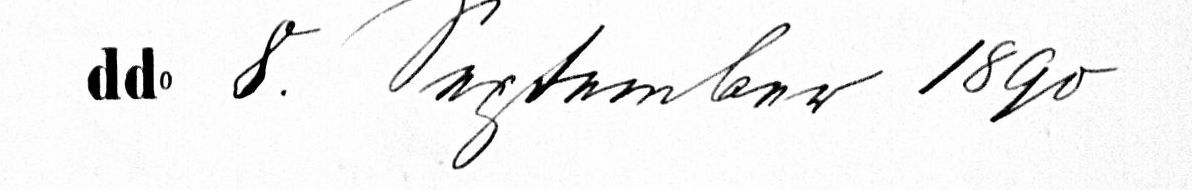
dd° 8. September 1890
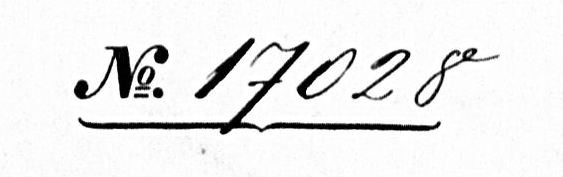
N° 17028
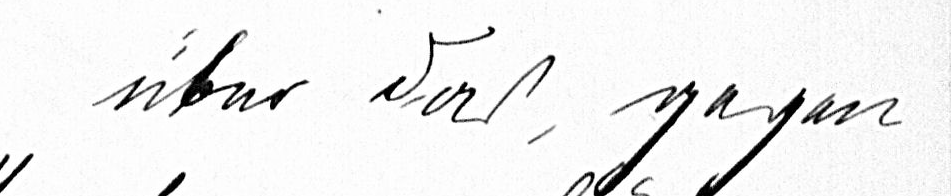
über das, gegen
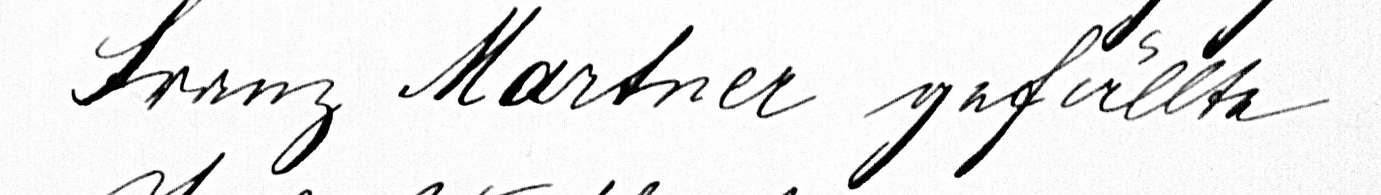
Franz Martner gefällte
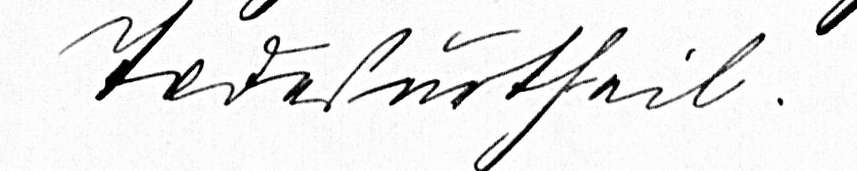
Todesurtheil.
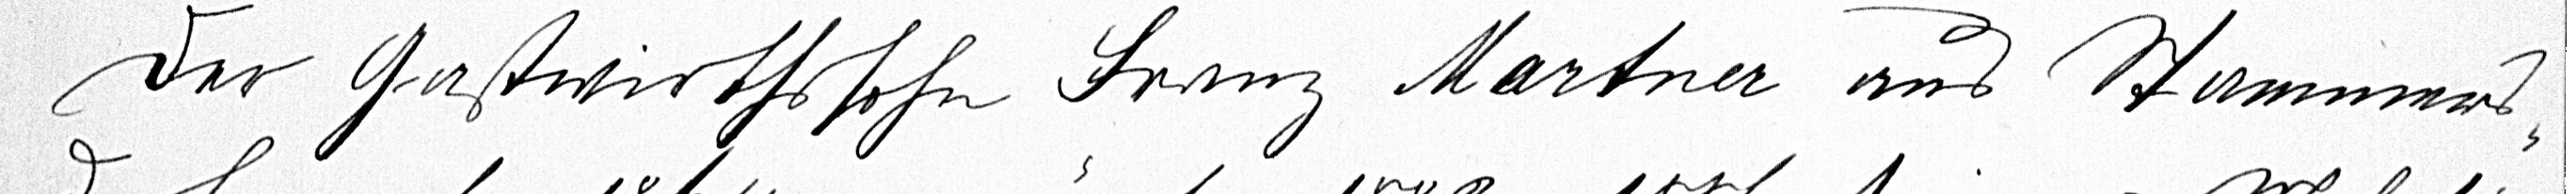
Der Gastwirthssohn Franz Martner aus Stammers¬
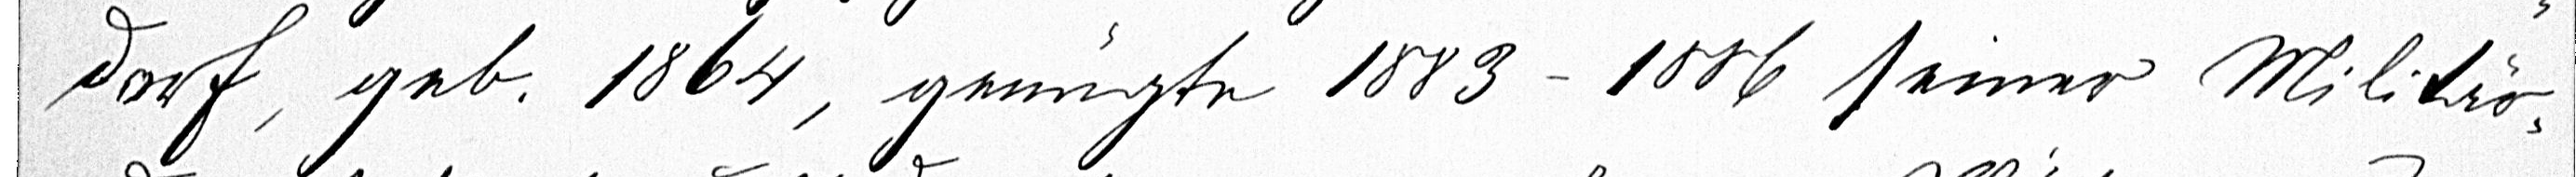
dorf, geb. 1864, genügte 1883-1886 seiner Militär¬
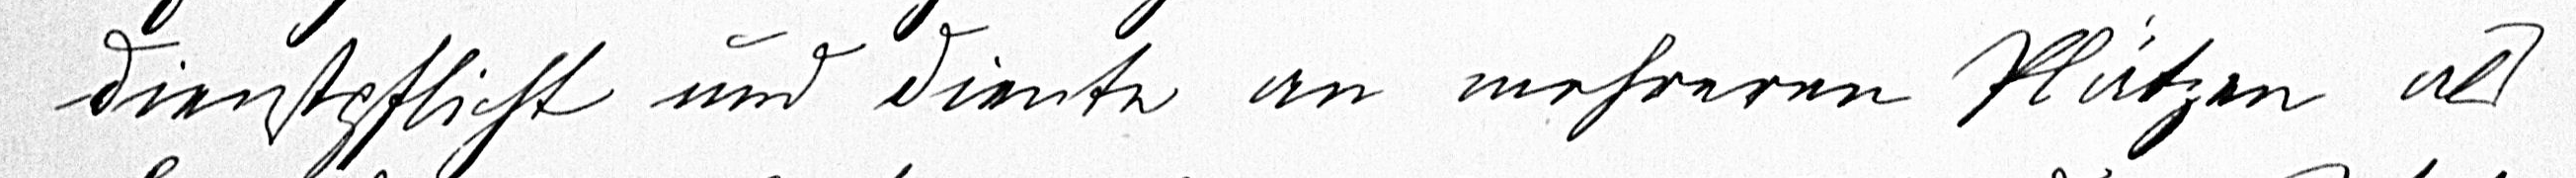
dienstpflicht und Diente an mehreren Plätzen als
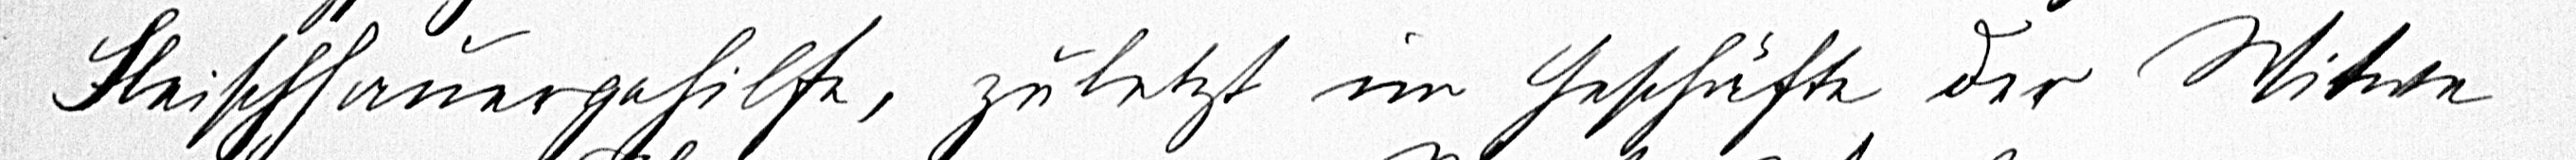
Fleischhauergehilfe, zuletzt im Geschäfte der Witwe
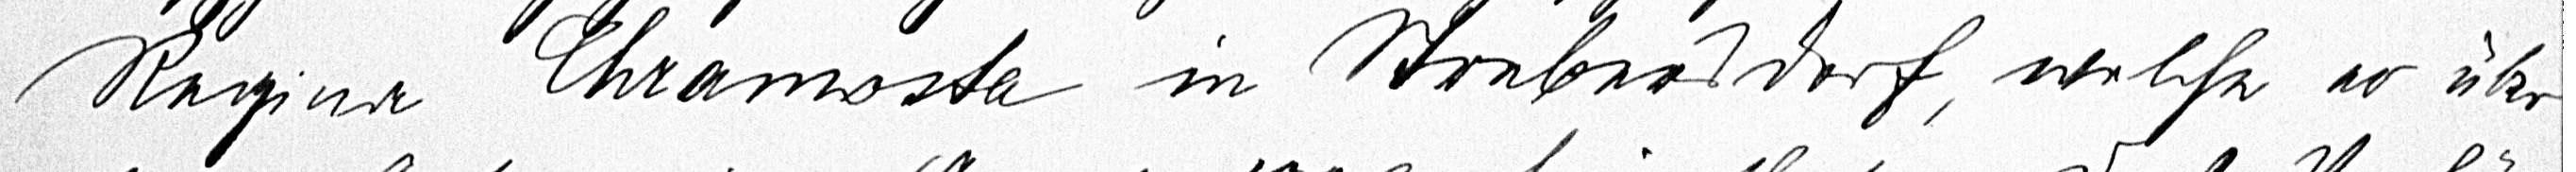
Regina Chramosta in Strebersdorf, welche er über
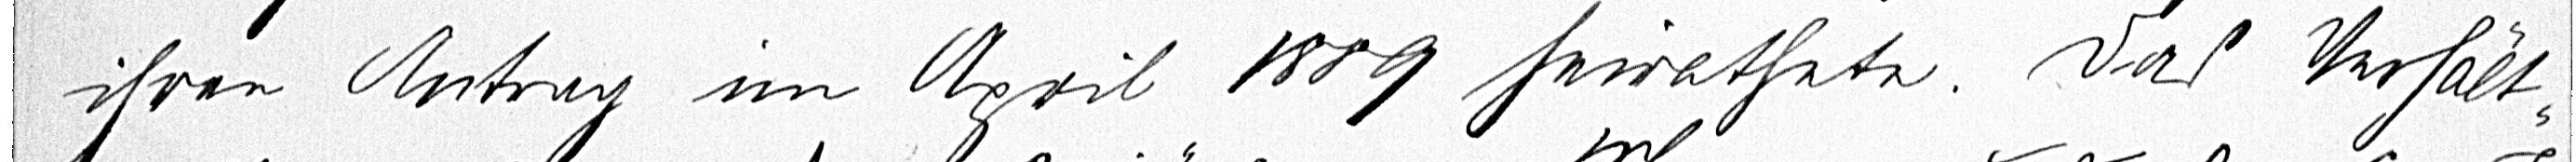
ihren Antrag im April 1889 heirathete. Das Verhält¬
